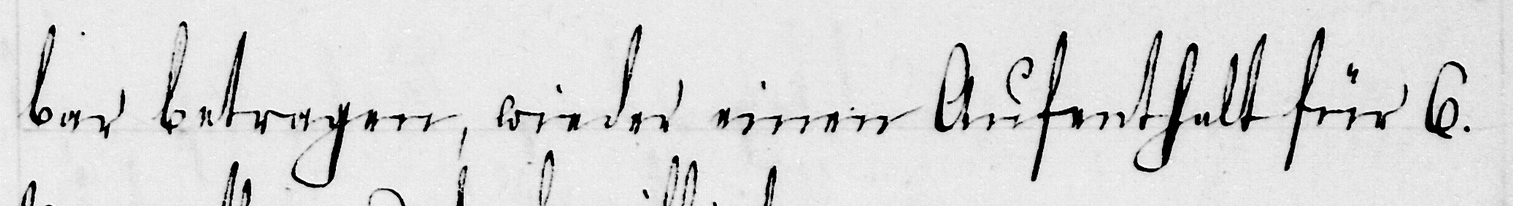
bar betragen, wieder einen Aufenthalt für 6.
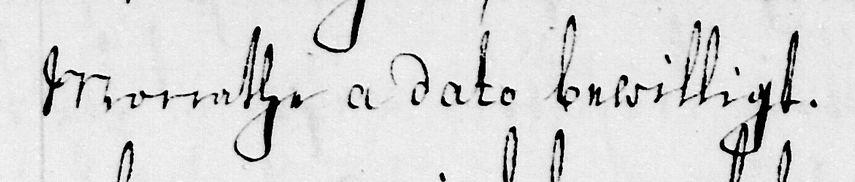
Monathe a dato bewilligt.
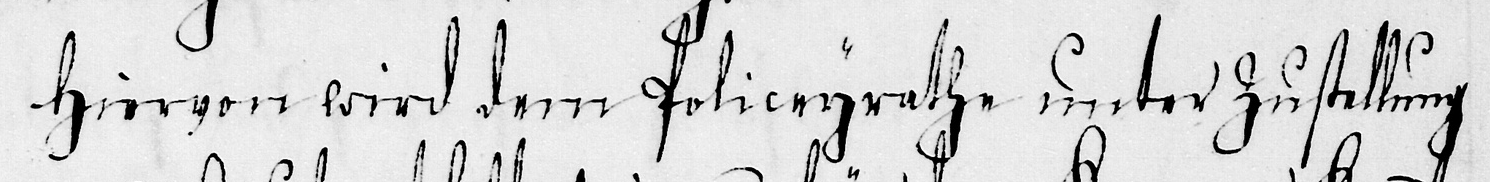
Hiervon wird dem Policeyrathe unter Zustellung
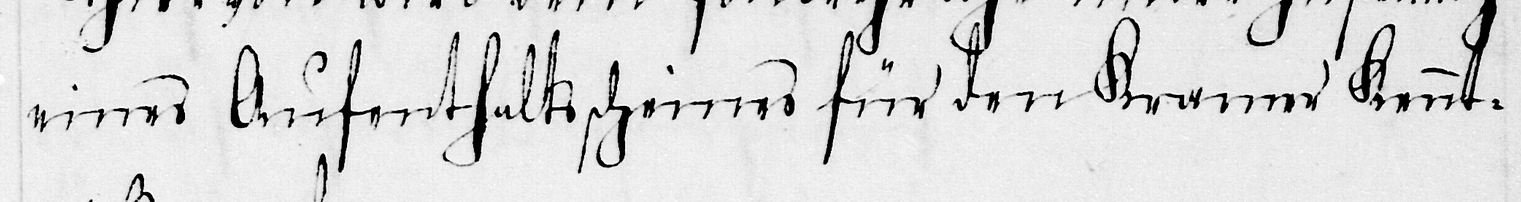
eines Aufenthaltsscheines für den Kramer Kennt¬
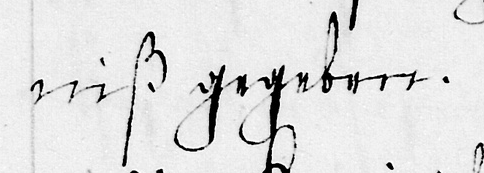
niß gegeben.
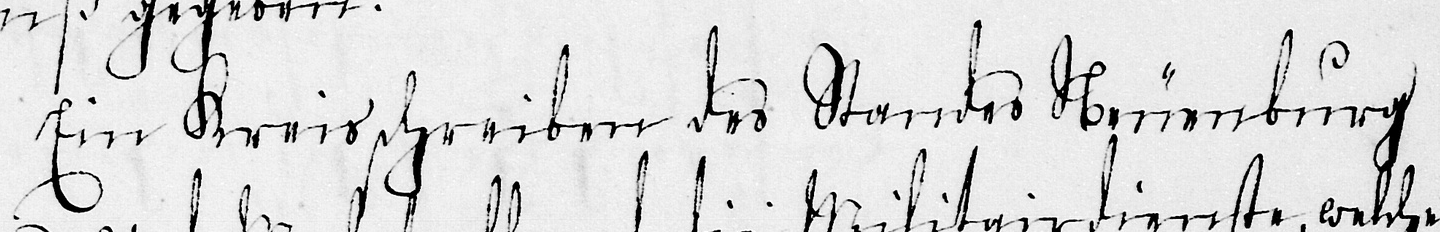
Ein Kreisschreiben des Standes Neuenburg
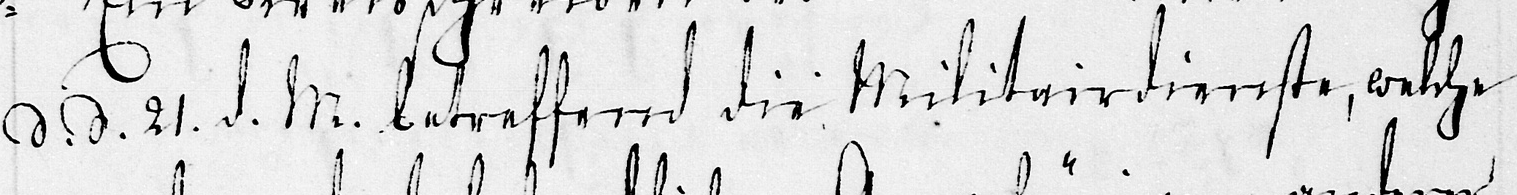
d. d. 21. d. M. betreffend die Militairdienste, welche
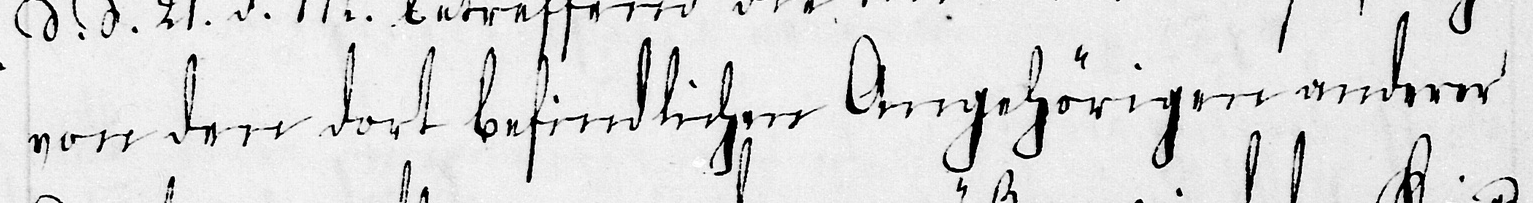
von den dort befindlichen Angehörigen anderer
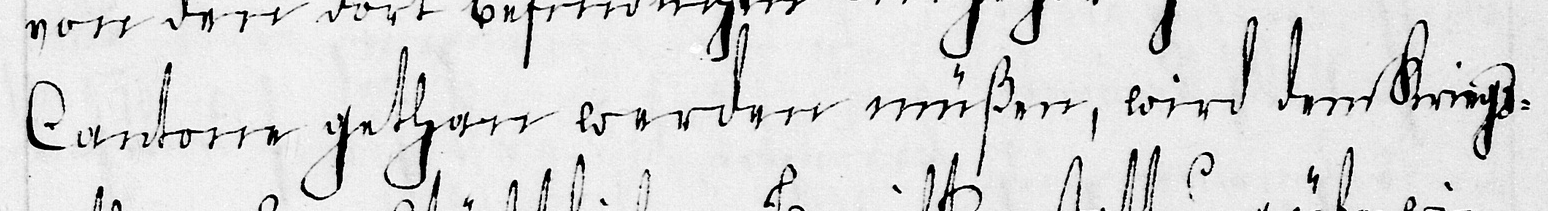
Cantone gethan werden müßen, wird dem Kriegs¬
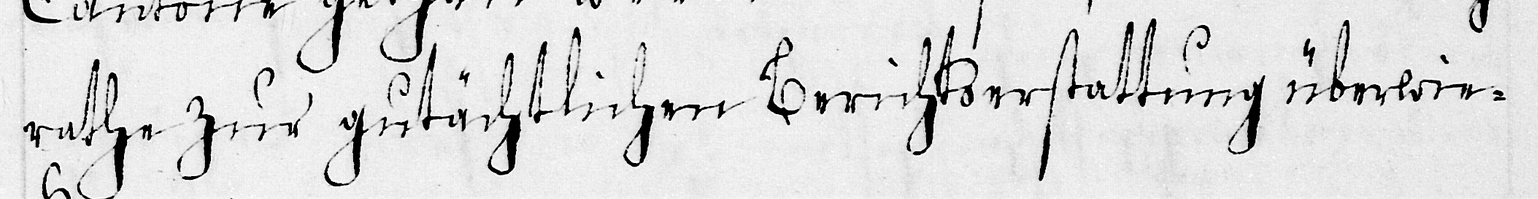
rathe zur gutächtlichen Berichtserstattung überwie¬
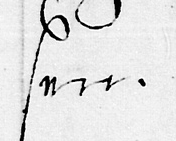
sen.
